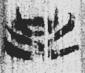足
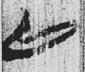㠯
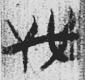○（捍）
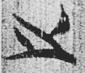之
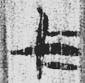上下
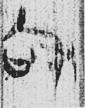和
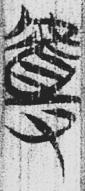○（且）
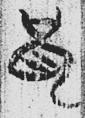○（輯）
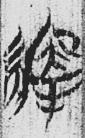繲
